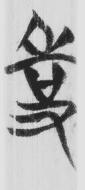事
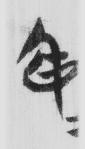身=
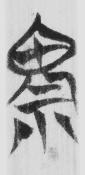{鬼示}
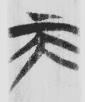天
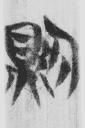則
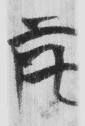厇
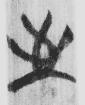至
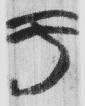于
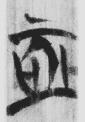亟
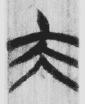夫
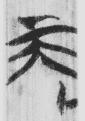天
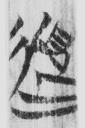道
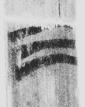三
